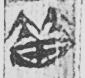昔
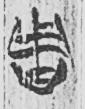周
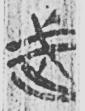武
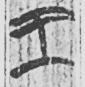王
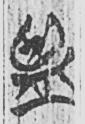監
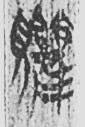觀
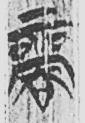商
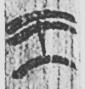王
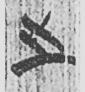之
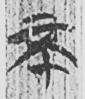不
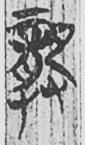{龍廾}
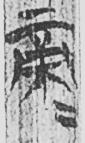{上帝}=
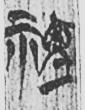禋
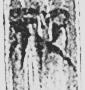祀
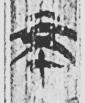不
